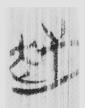赶
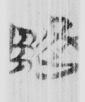{阩止}
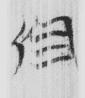於
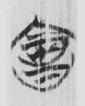會
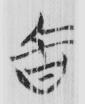旨
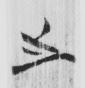之
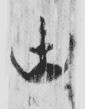山
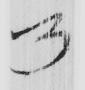乃
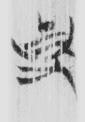史
